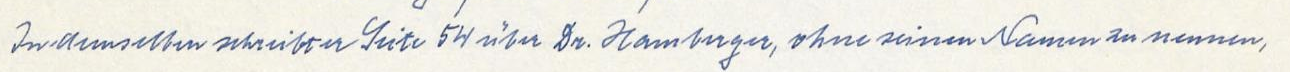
In demselben schreibt der Seite 54 über Dr. Hamberger, ohne seinen Namen zu nennen,
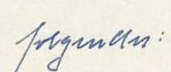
folgendes:
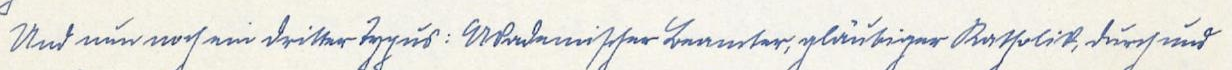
Und nun noch ein dritter Typus: Akademischer Beamter, gläubiger Katholik, durch und
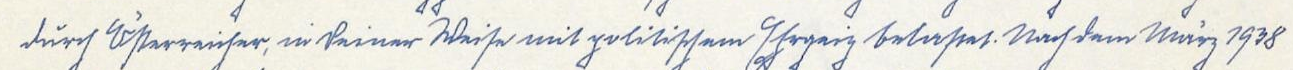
durch Österreicher, in keiner Weise mit politischem Ehrgeiz wird belastet. Nach dem März 1938
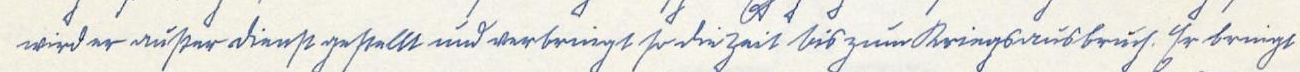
wird er außer Dienst gestellt und verbringt so die Zeit bis zum Kriegsausbruch. Er bringt
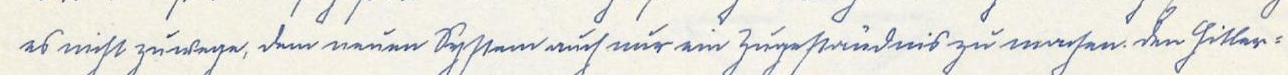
ist nicht zuwege, dem neuen System auch nur ein Zugeständnis zu machen. Den Hitler-
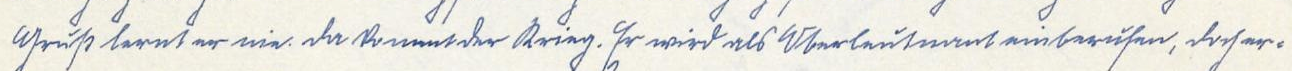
Gruß lernt er nie. Da kommt der Krieg. Er wird als Oberleutnant einberufen, doch er-
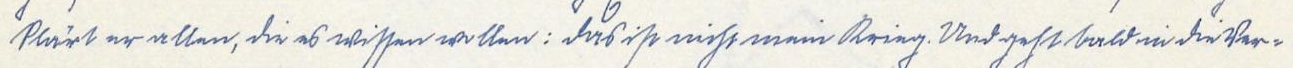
klärt er allen, die es wissen wollen: Das ist nicht mein Krieg. Und geht bald in die Ver-
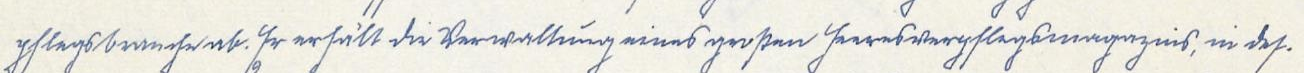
pflegsbranche ab. Er erhält die Verwaltung eines großen Heeresverpflegungsmagazins, in des-
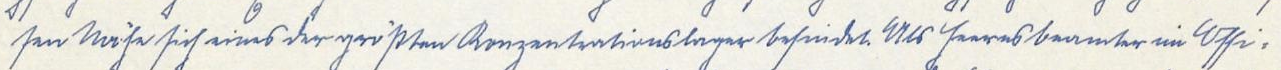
sen Nähe sich eines der größten Konzentrationslager befindet. Als Heeresbeamter im Offi-
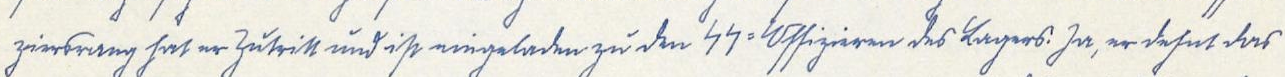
ziersrang hatte Zutritt und ist eingeladen zu den SS-Offizieren des Lagers. Ja, er dehnt das
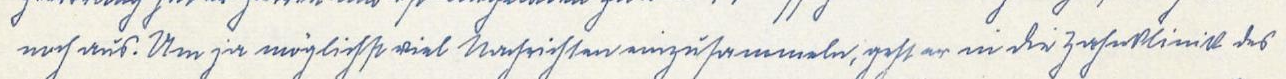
noch aus. Um ja möglichst viel Nachrichten einzusammeln, geht er in die Zahnklinik des
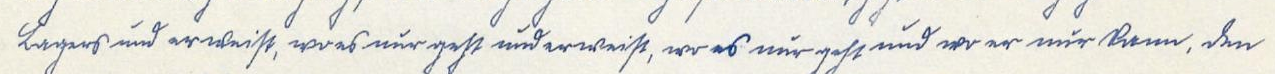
Lagers und erweist, wo es nur geht, und erweist, wo es nur geht und wo er nur kann, den
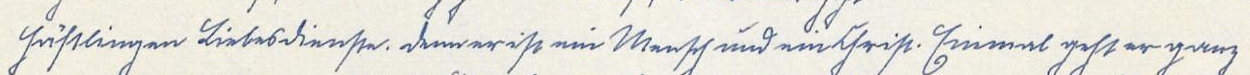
Häftlingen Liebesdienste. Denn er ist ein Mensch und ein Christ. Einmal geht er ganz
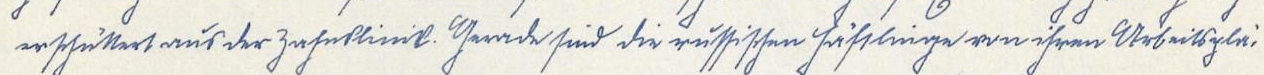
erschüttert aus der Zahnklinik. Gerade sind die russischen Häftlinge von ihren Arbeitsplä
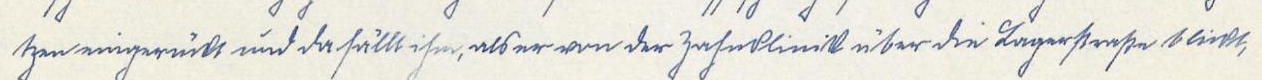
tzen eingerückt und da fällt ihm, als er von der Zahnklinik über die Lagerstraße blickt,
